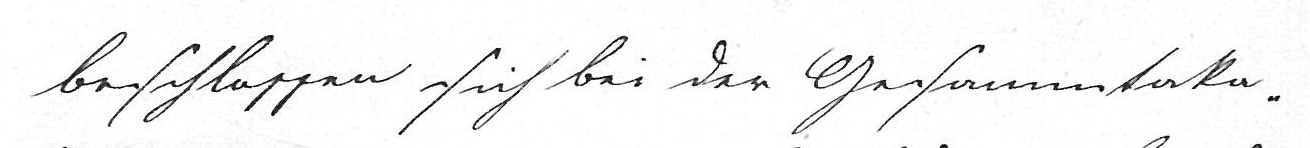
beschlossen sich bei der Gesamtaka-
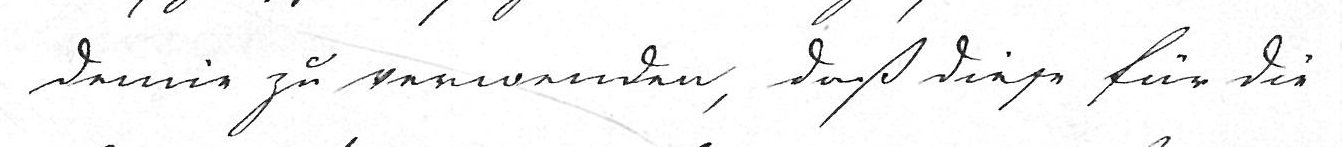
demie zu verwenden, daß diese für die
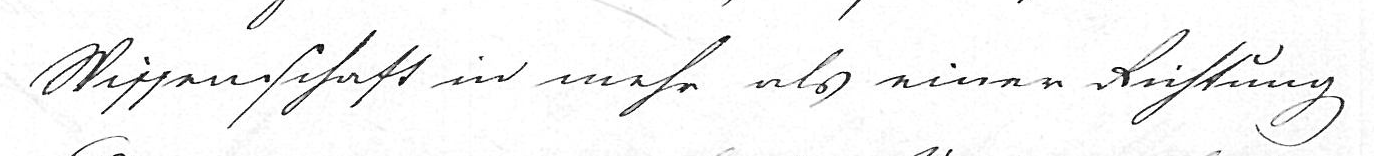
Wissenschaft in mehr als einer Richtung
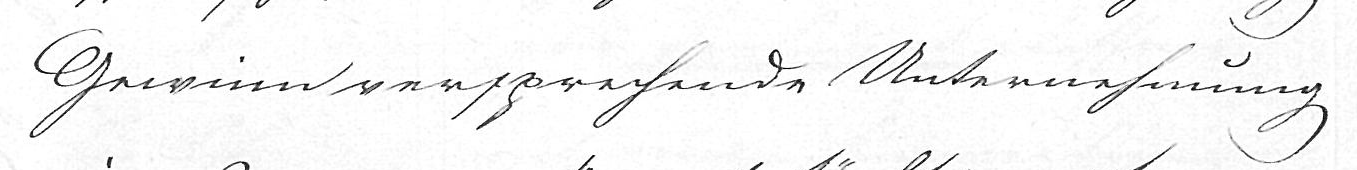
Gewinn versprechende Unternehmung
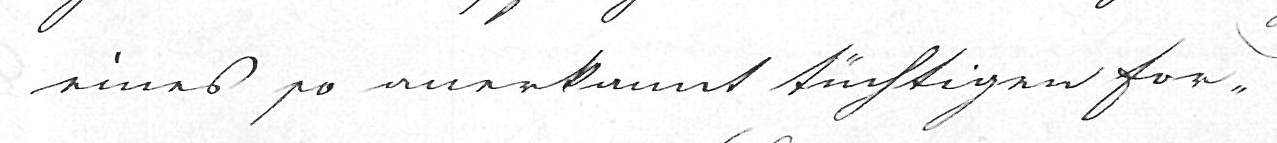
eines so anerkannt tüchtigen For-
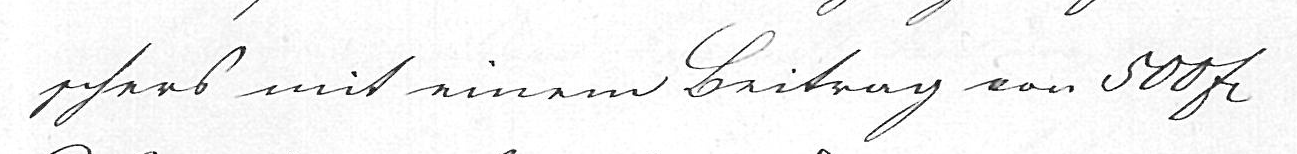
schers mit einem Beitrag von 500 fl.
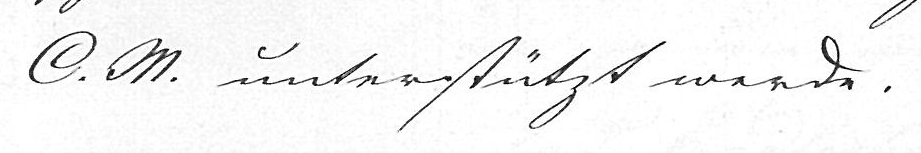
C.M. unterstützt werde.
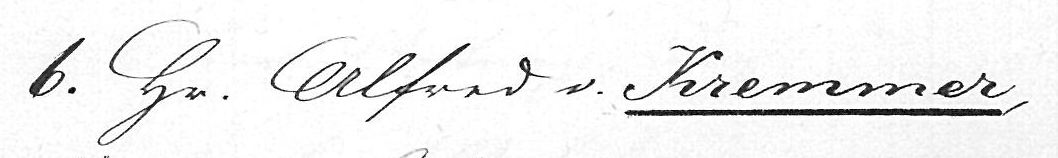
b. Hr. Alfred v. Kremmer
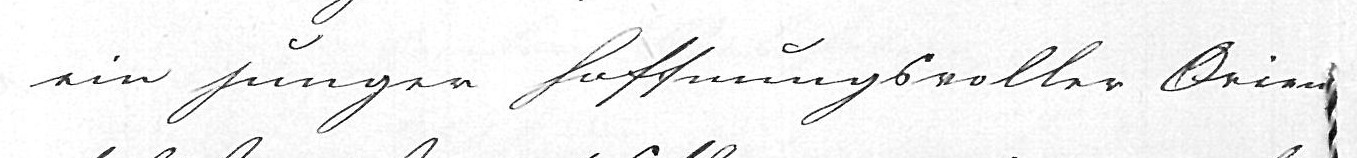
ein jungen hoffnungsvoller Orien-
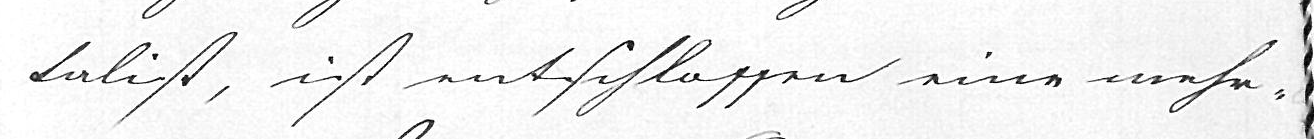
talist, ist entschlossen eine mehr-
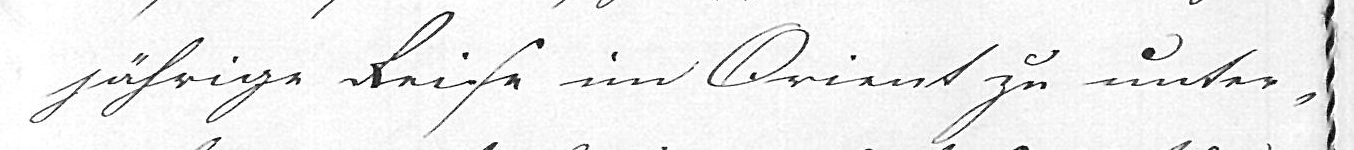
jährige Reise im Orient zu unter-
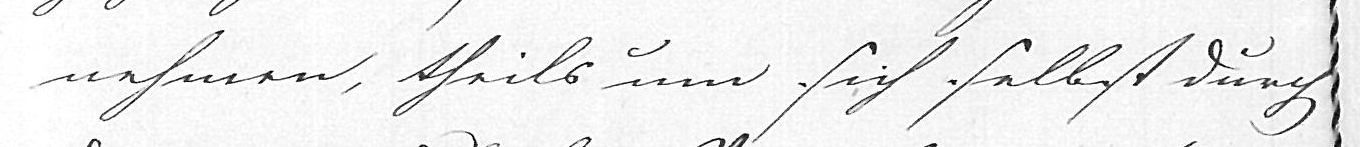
nehmen, theils und sich selbst durch
